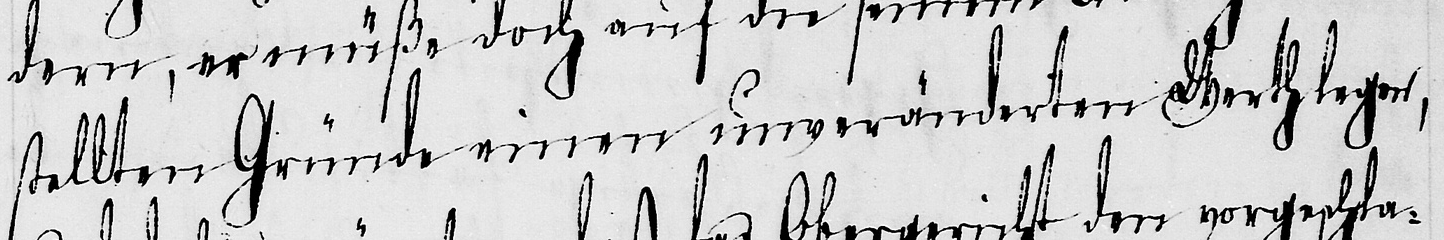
tellten Gründe einen unveränderten Werth legen,
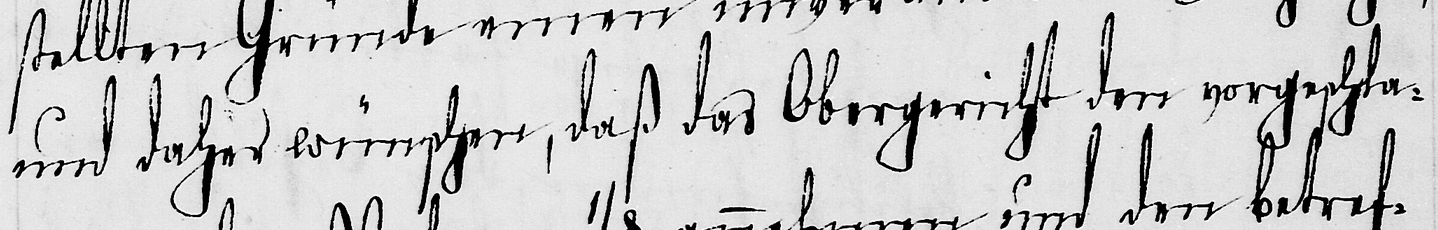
und daher wünschen, daß das Obergericht den vorgeschla¬
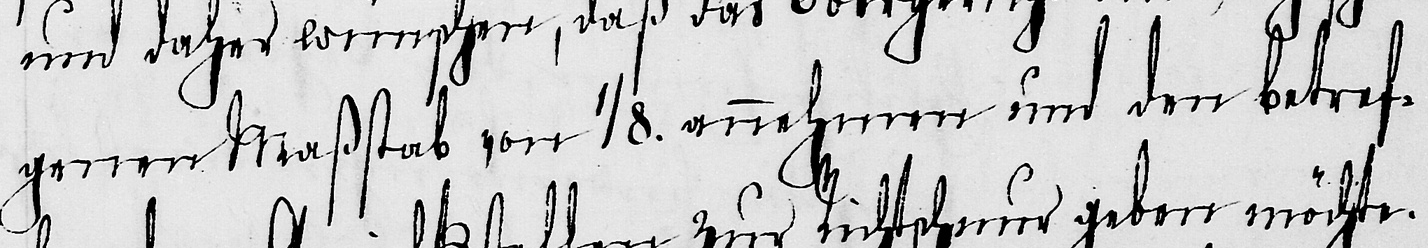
genen Maßstab von 1/8. annehmen und den betref¬
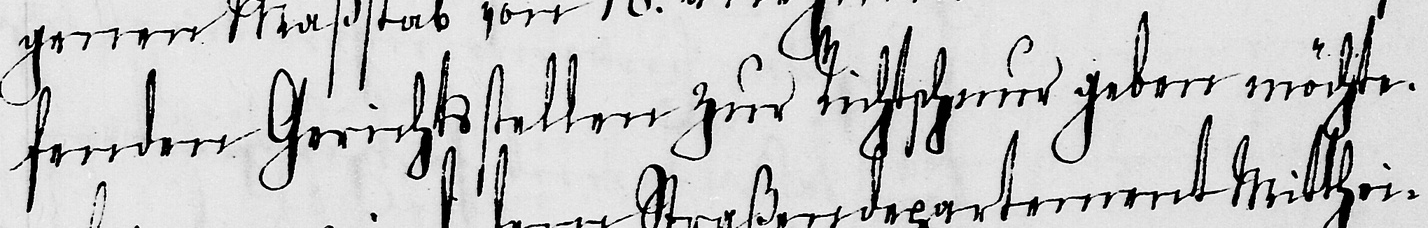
fenden Gerichtsstellen zur Richtschnur geben möchte.
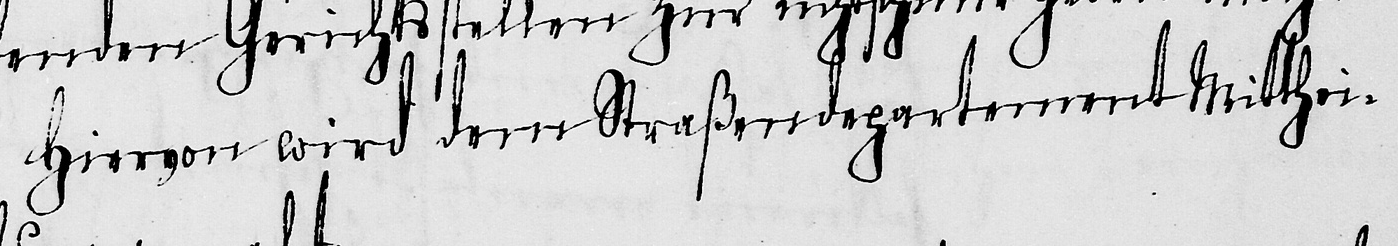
Hiervon wird dem Straßendepartement Mitthei¬
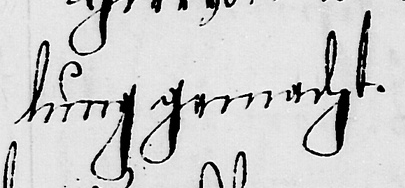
lung gemacht.
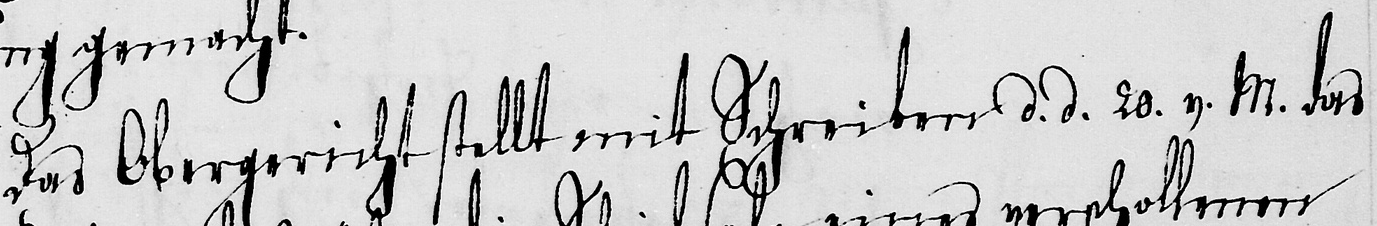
Das Obergericht stellt mit Schreiben d. d. 20. v. M. das
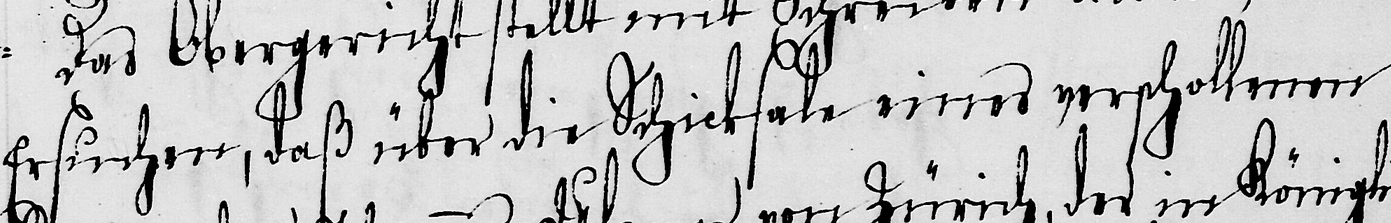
Ersuchen, daß über die Schicksale eines verschollenen
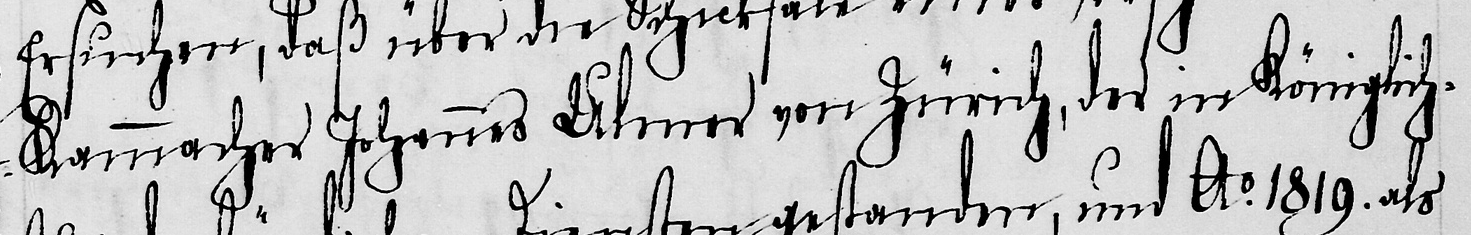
Kammacher Johannes Ulmer von Zürich, der in Königlic¬
